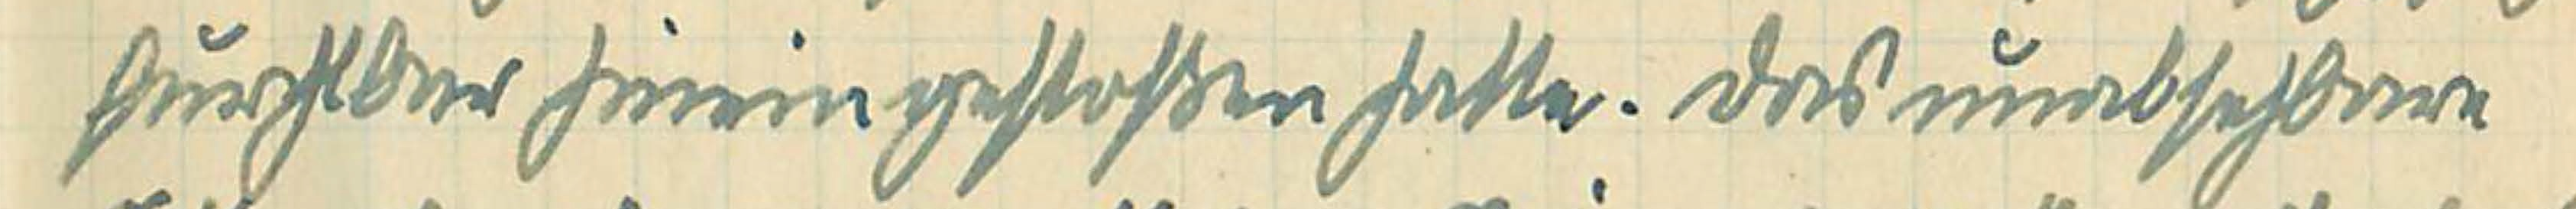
furchtbar hineingestoßen hatte. Das unabsehbare
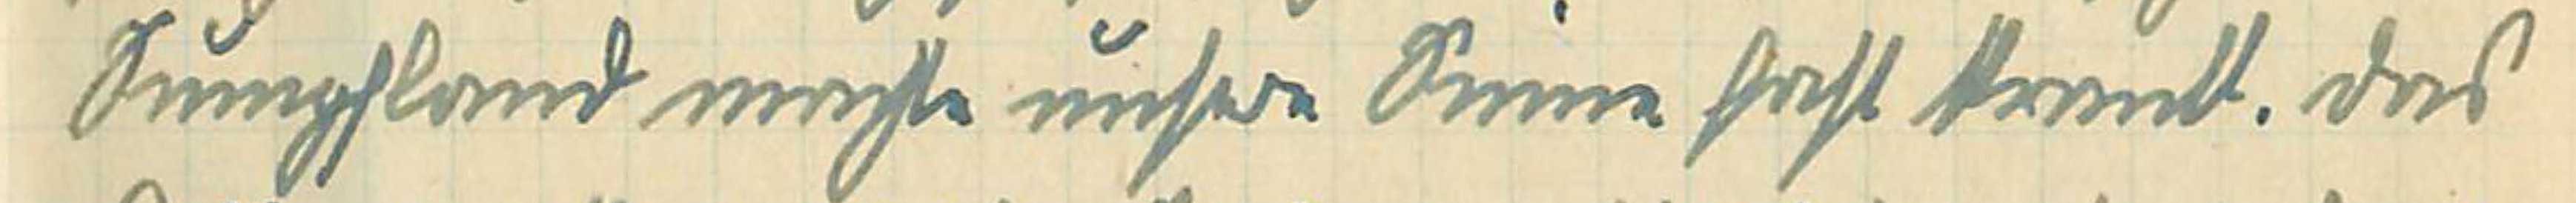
Sumpfland machte unsere Sinne fast krank. Das
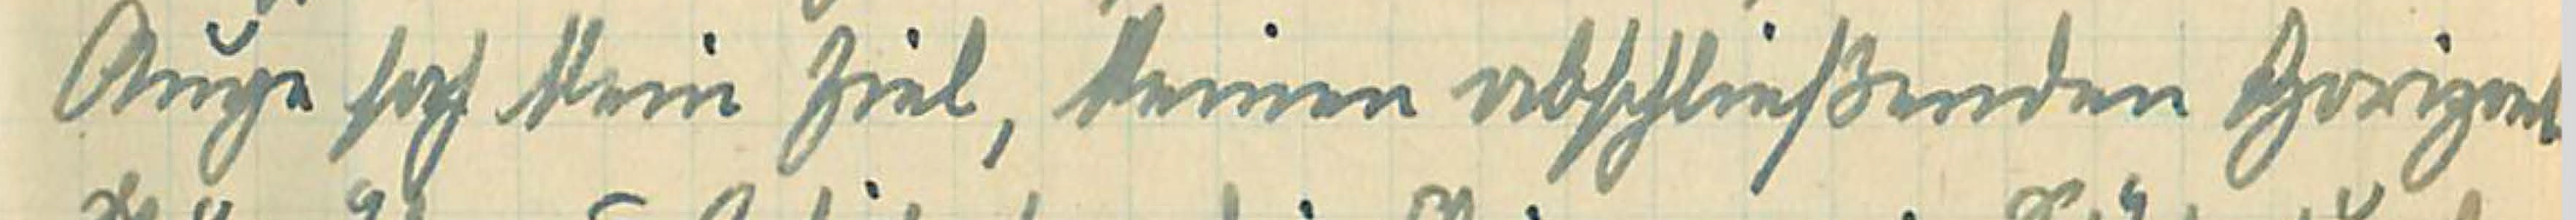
Auge sah kein Ziel, keinen abschließenden Horizont.
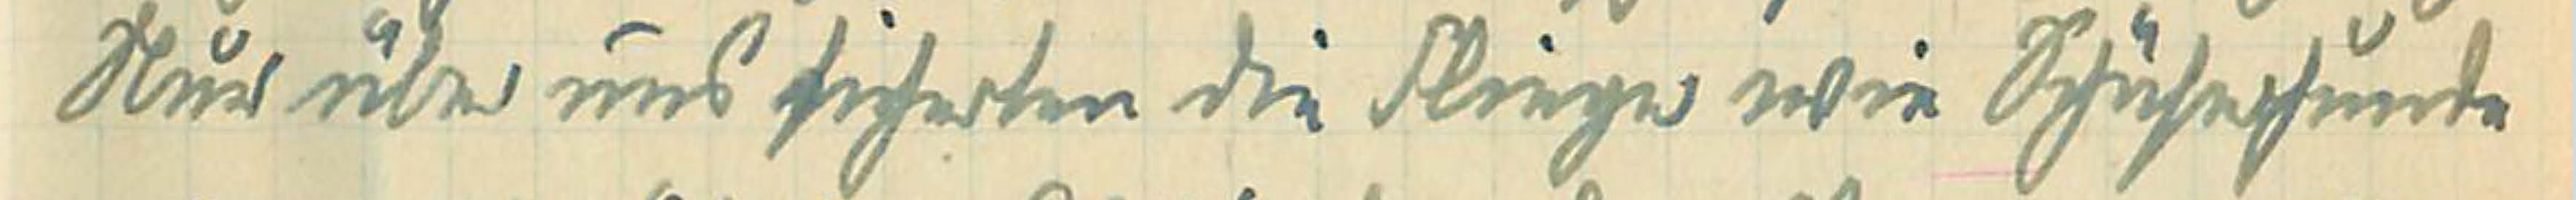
Nur über uns sicherten die Flieger wie Schäferhunde
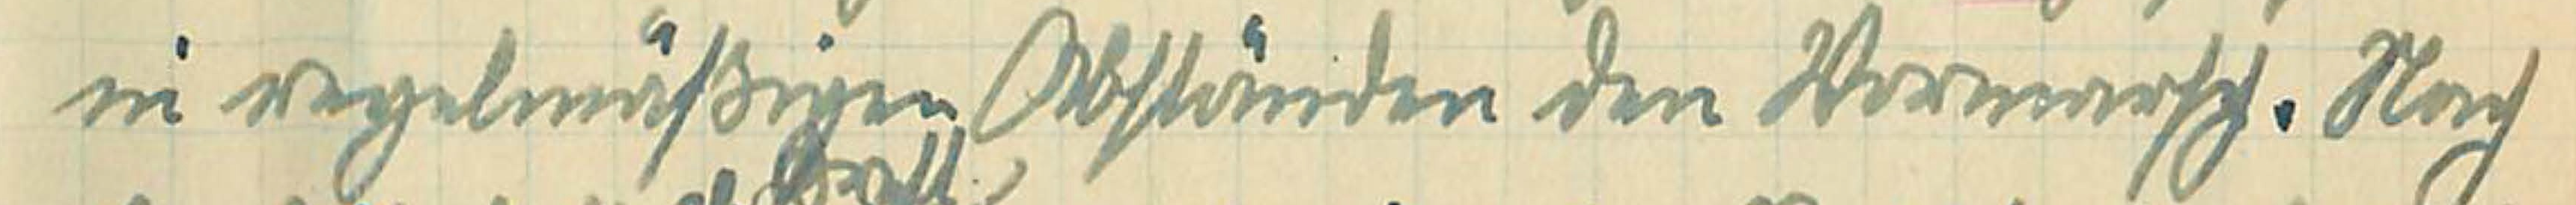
in regelmäßigen Abständen den Vormarsch. Nach
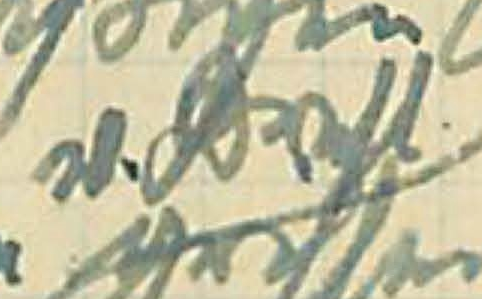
v. Brest
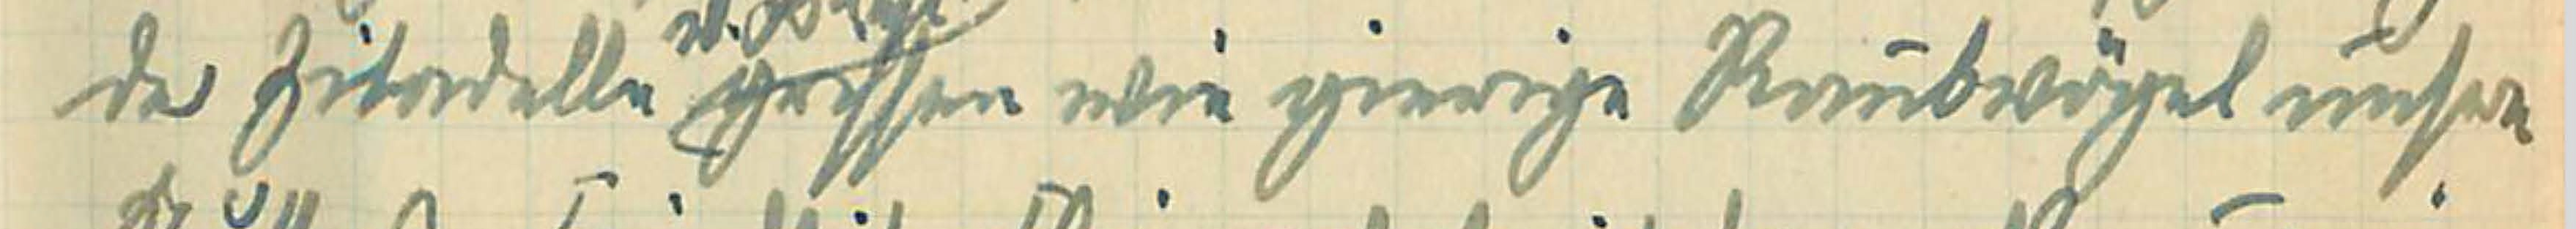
der Zitadelle griffen wie gierige Raubvögel unsre
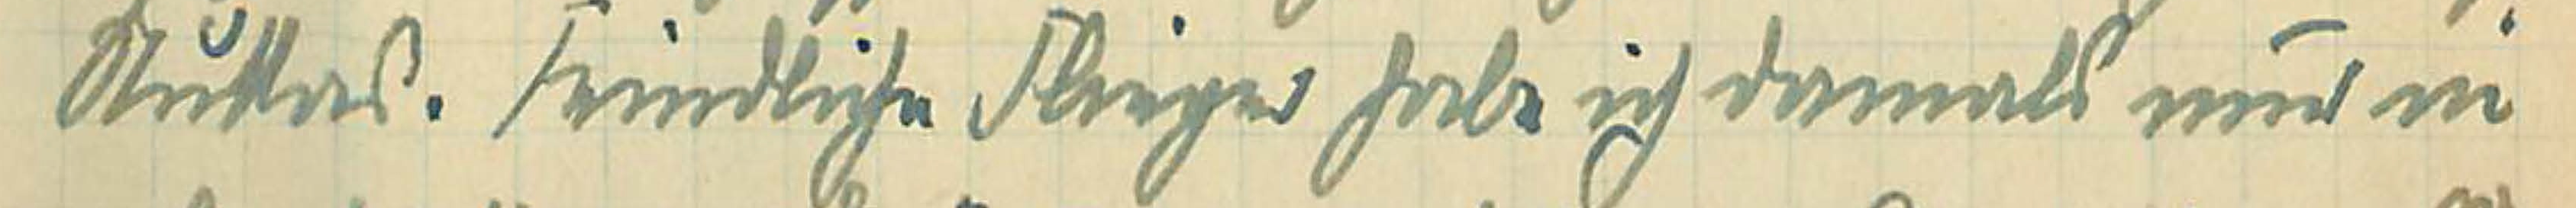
Stukas. Feindliche Flieger habe ich damals nur in
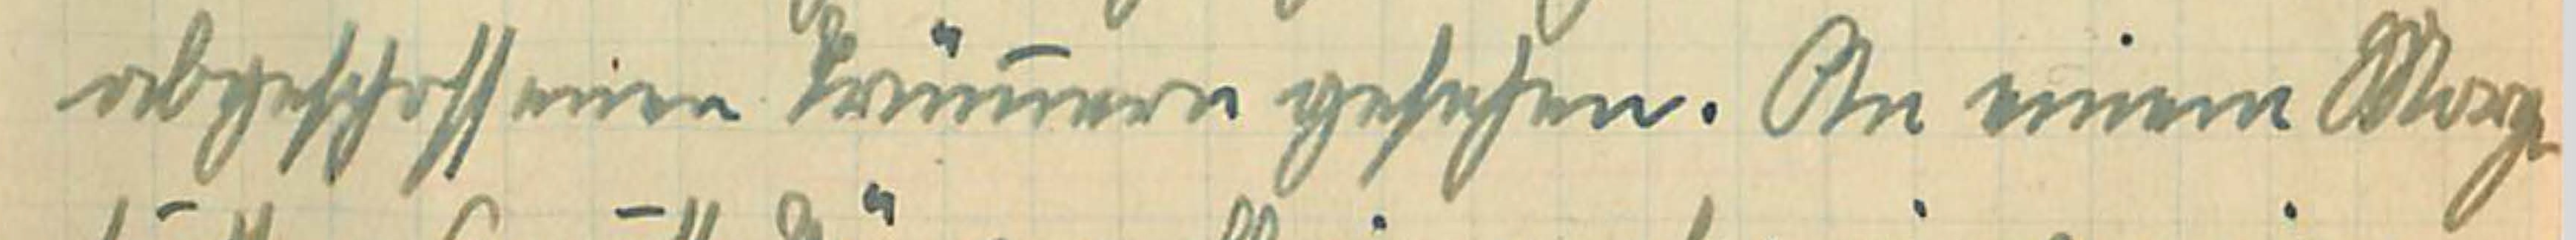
abgeschossenen Trümmern gesehen. An einem Morgen
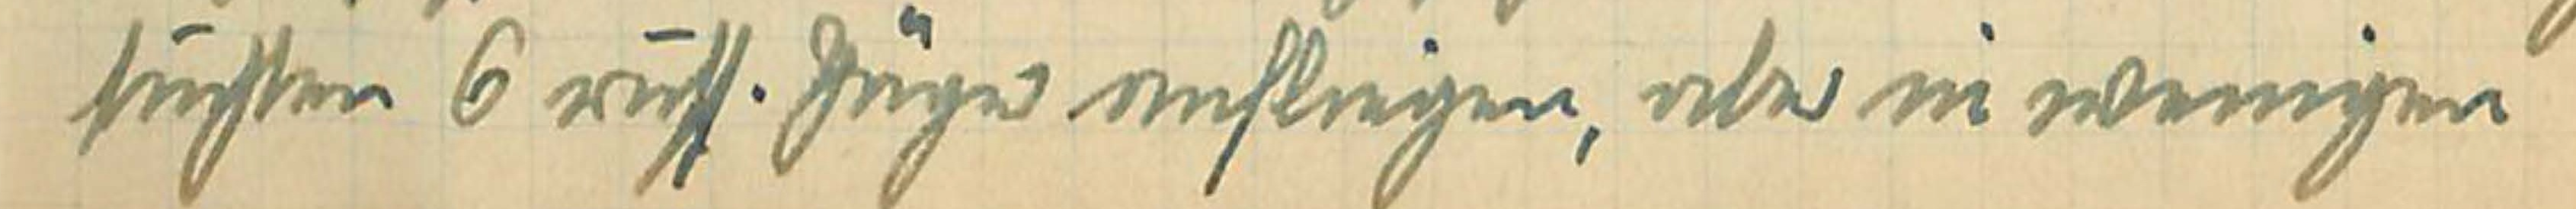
suchten 6 russ. Jäger anfliegen, aber in wenigen
